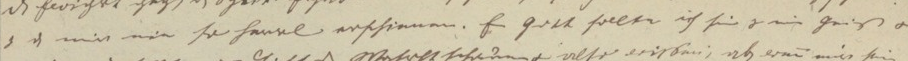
& die mir nie so herrl. erschienen. Ein Gott sollte ich sein & ein Geist &
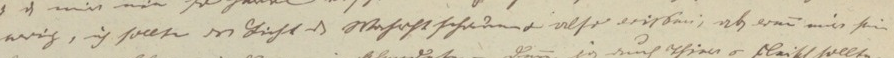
ewig, ich sollte ds Licht der Wahrheit schauen & also wissen; aber wenn mir sein
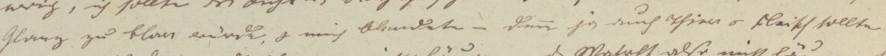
Glanz zu klar würde, & mich blendete – denn ja auch Thier & Fleisch sollte
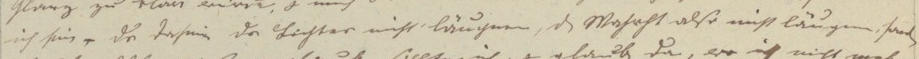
ich sein & ds Dasein ds Lichtes nicht läugnen, die Wahrht also nicht läugnen, sondern
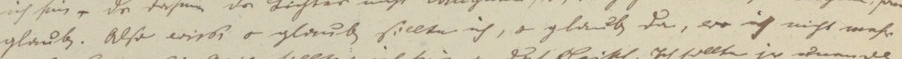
glauben. Also wissen & glauben sollte ich, & glauben da, wo ich nicht mehr
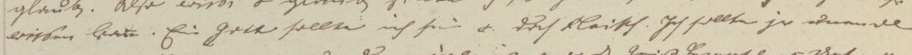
wissen kann. Ein Gott sollte ich sein & doch Fleisch. Ich sollte jener unendl.
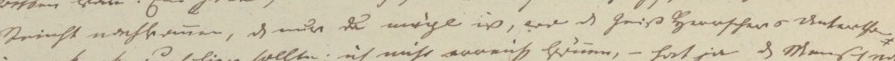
Reinheit nachkommen, die nur da mögl. ist, wo der Geist Heerschar & Unterthan
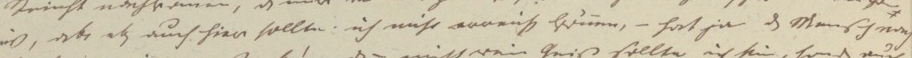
ist, aber eben auch hier sollte ich nicht erreichen können, – hat ja der Mensch nach
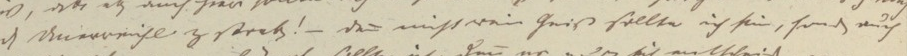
dem Unerreichlichen z streben! – Denn nicht rein Geist sollte ich sein, sondern auch
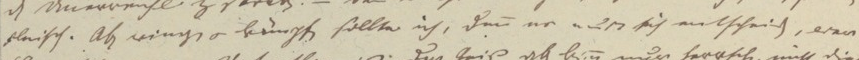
Fleisch. Aber ringen & kämpfen sollte ich, denn es muß sich entscheiden, wer
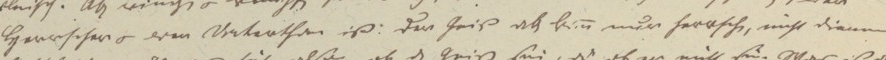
Herrscher & wer Unterthan ist. Der Geist aber kann nur herrschen, nicht dienen.
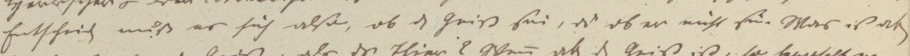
Entscheiden muß es sich also, ob der Geist sei, od ob er nicht sei. Was ist aber
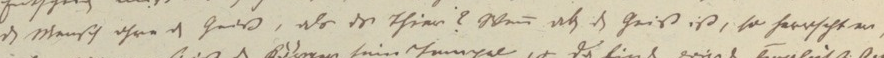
der Mensch ohne den Geist, als ds Thier? Wenn aber der Geist ist, so herrscht er,
